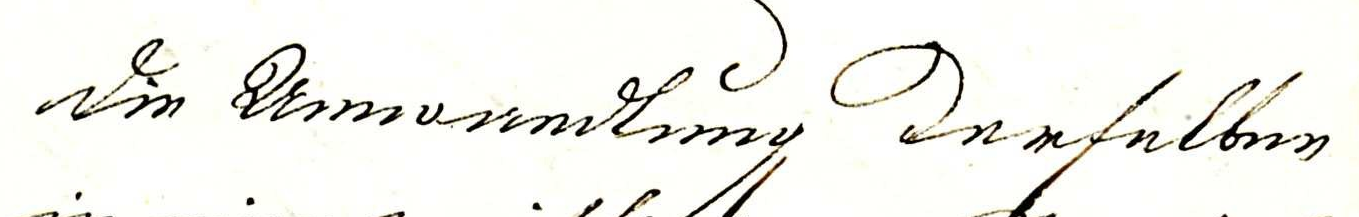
die Umwandlung derselben
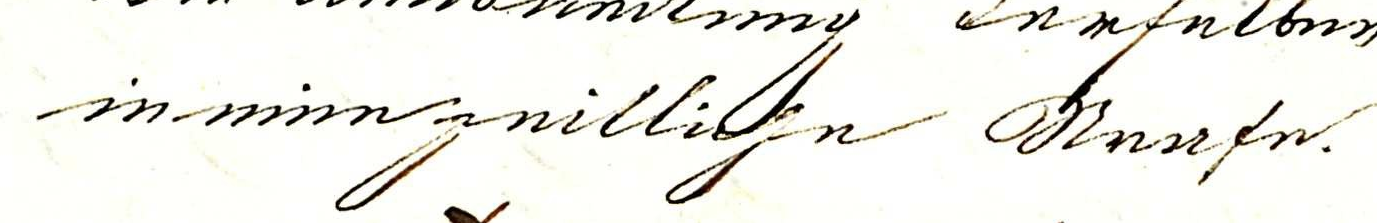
in eine zeitliche Strafe.
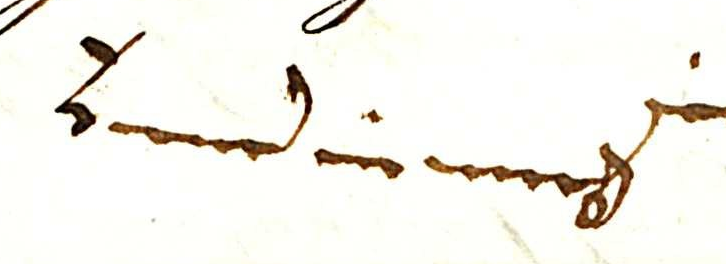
Ferdinand
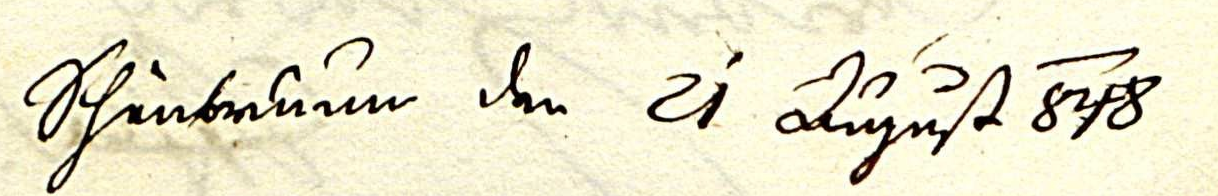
Schönbrunn den 21. August 1848
